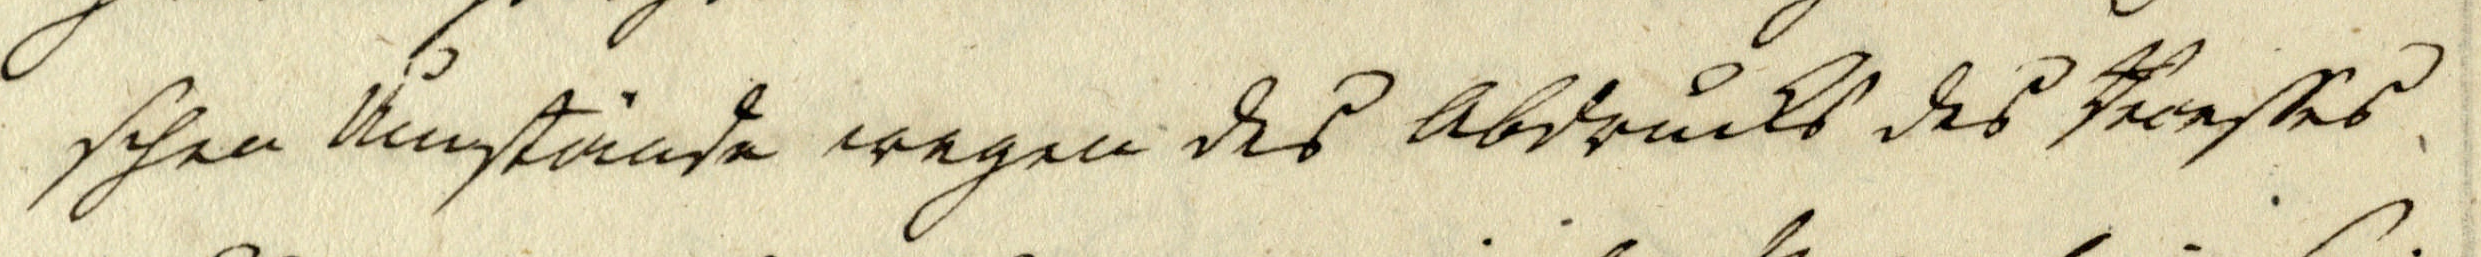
schen Umstände wegen des Abdrucks des Recesses
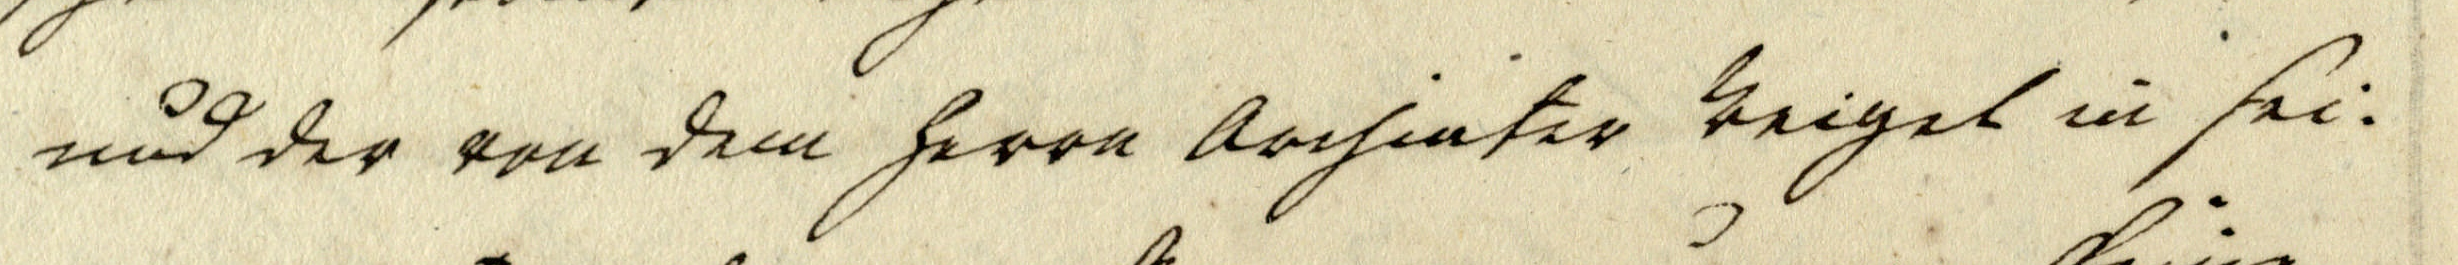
und der von dem Herrn Archiater Weigel in sei¬
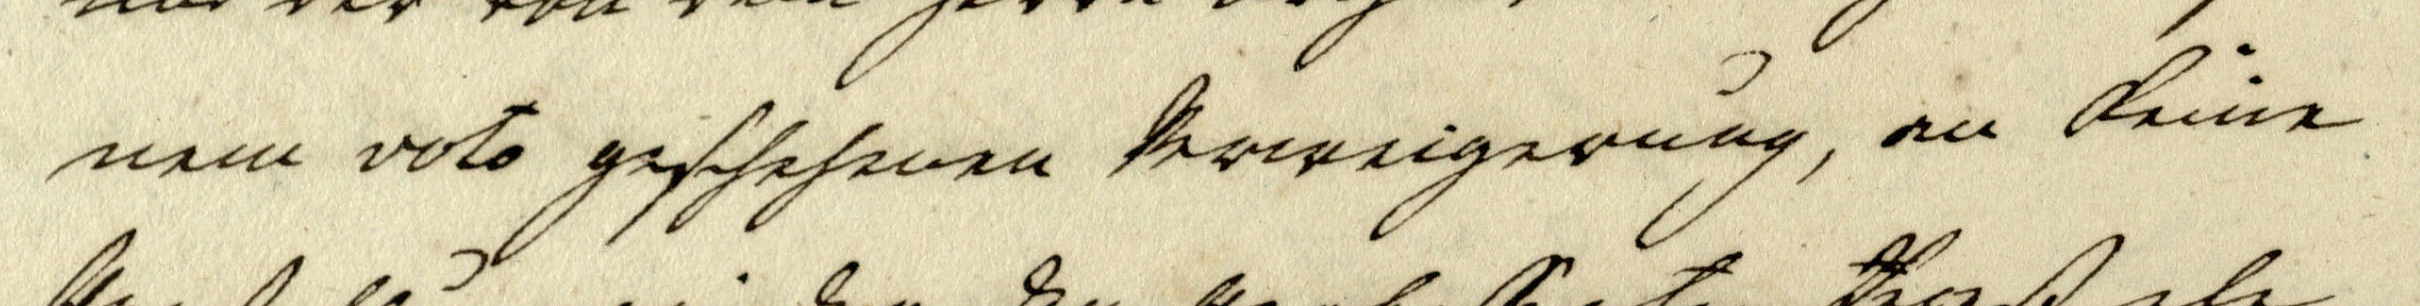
nem voto geschehenen Verweigerung, an keine
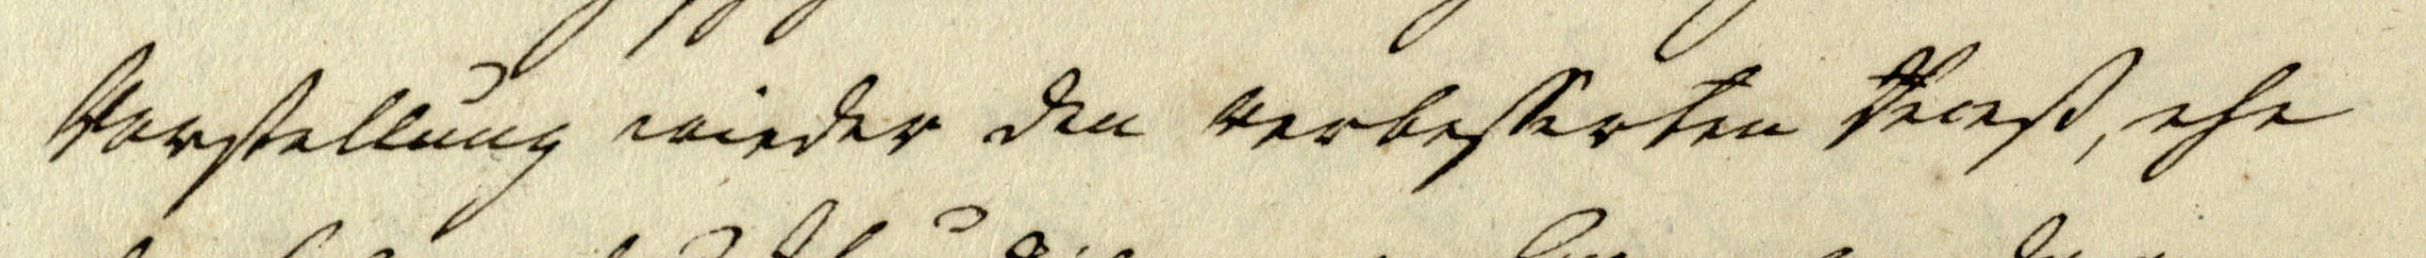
Vorstellung wieder den verbesserten Receß, ehe
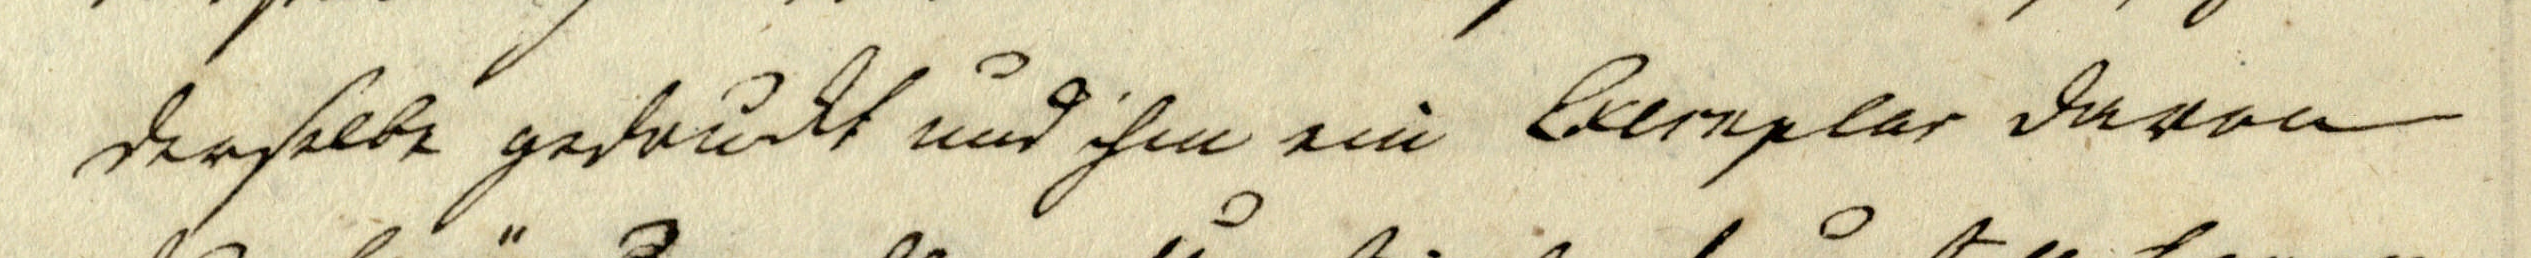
derselbe gedruckt und ihm ein Exemplar davon
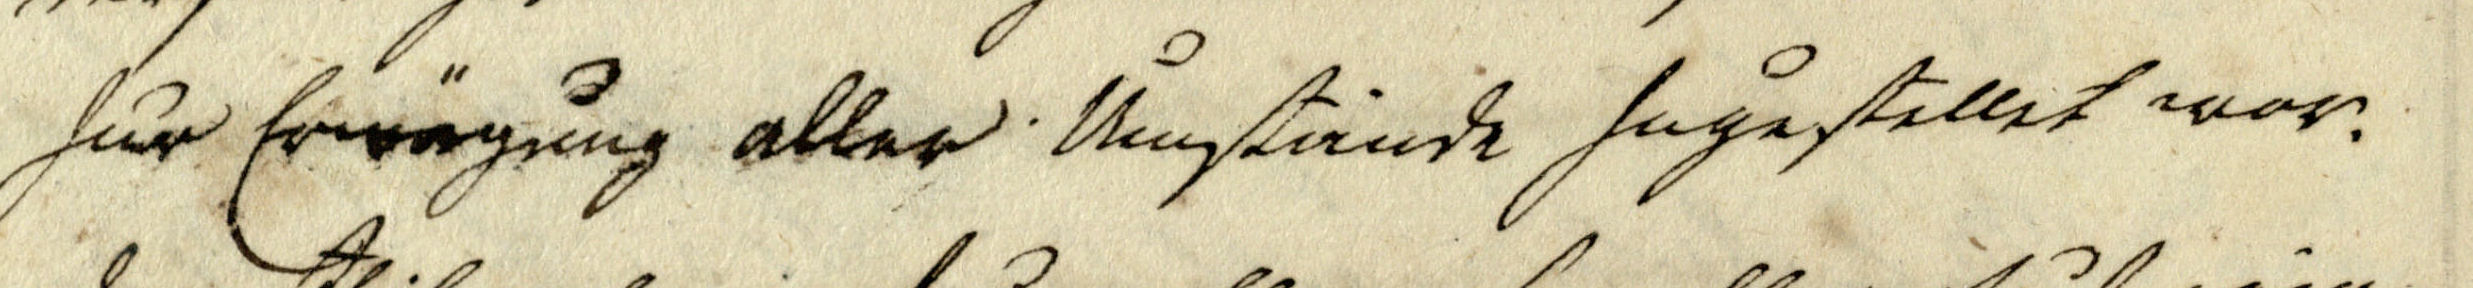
zur Erwägung aller Umstände zugestellet wor¬
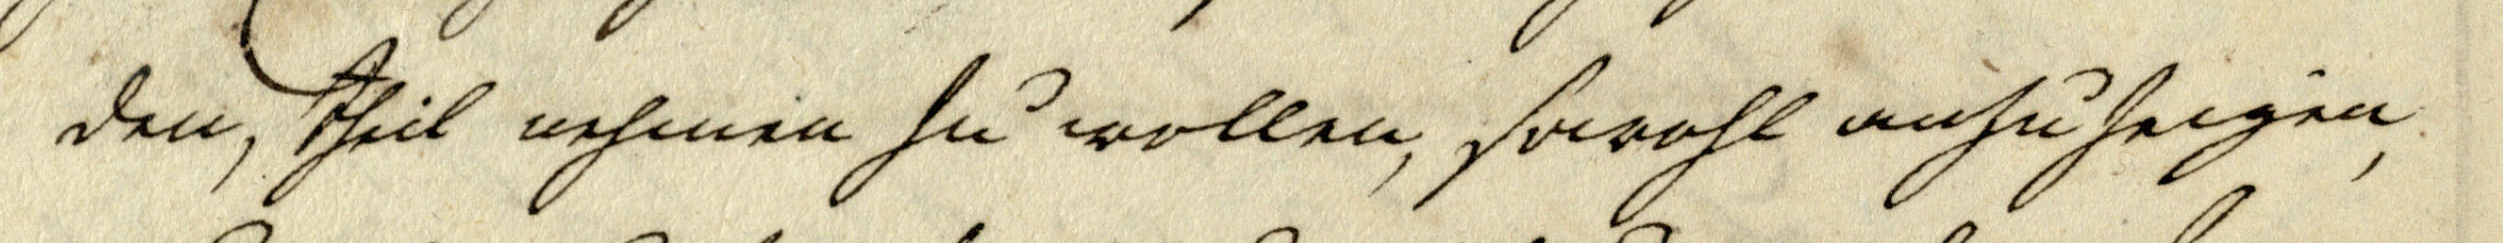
den, Theil nehmen zu wollen, sowohl anzuzeigen,
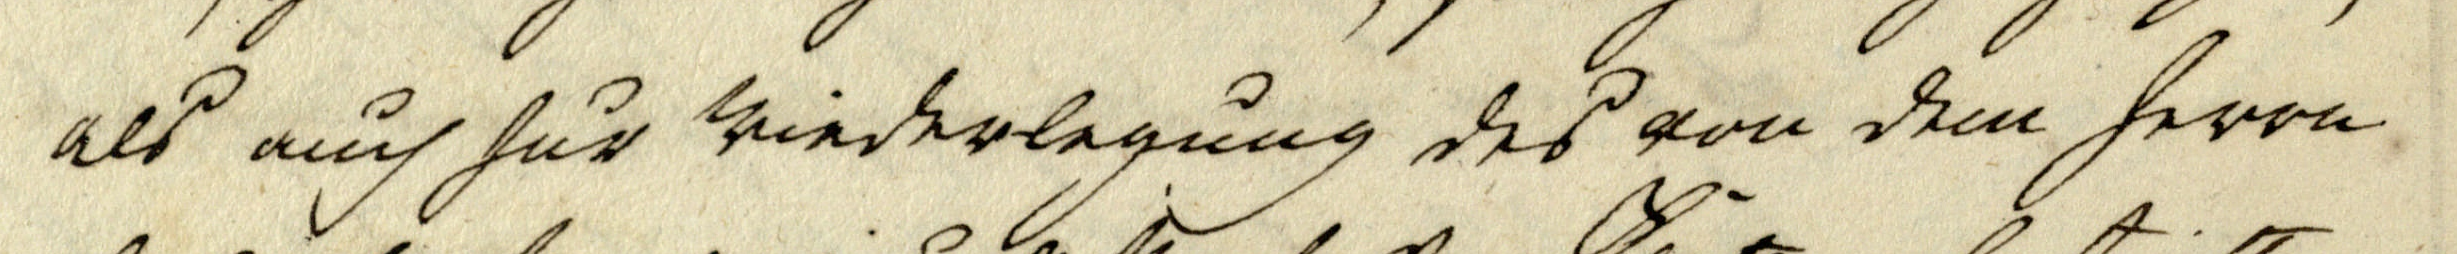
als auch zur Wiederlegung des von dem Herrn
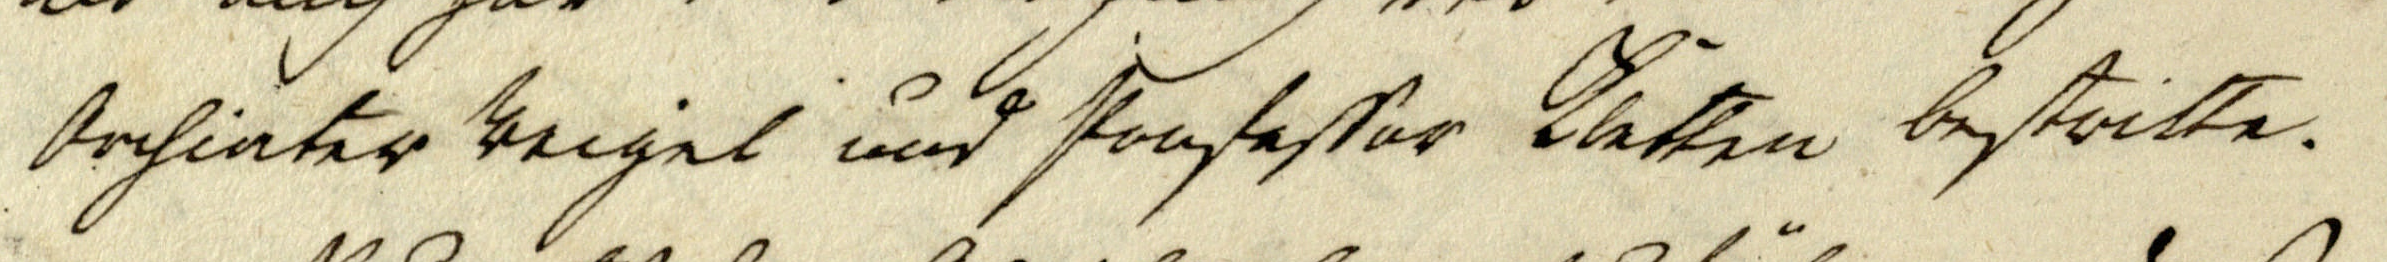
Archiater Weigel und Professor Kletten bestritte¬
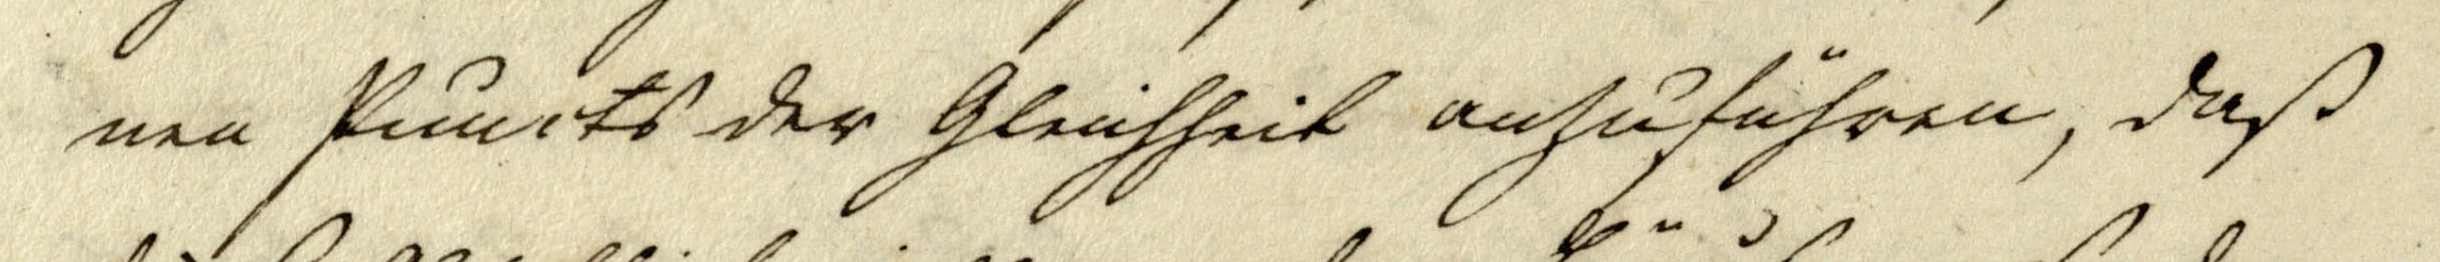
nen Puncts der Gleichheit anzuführen, daß
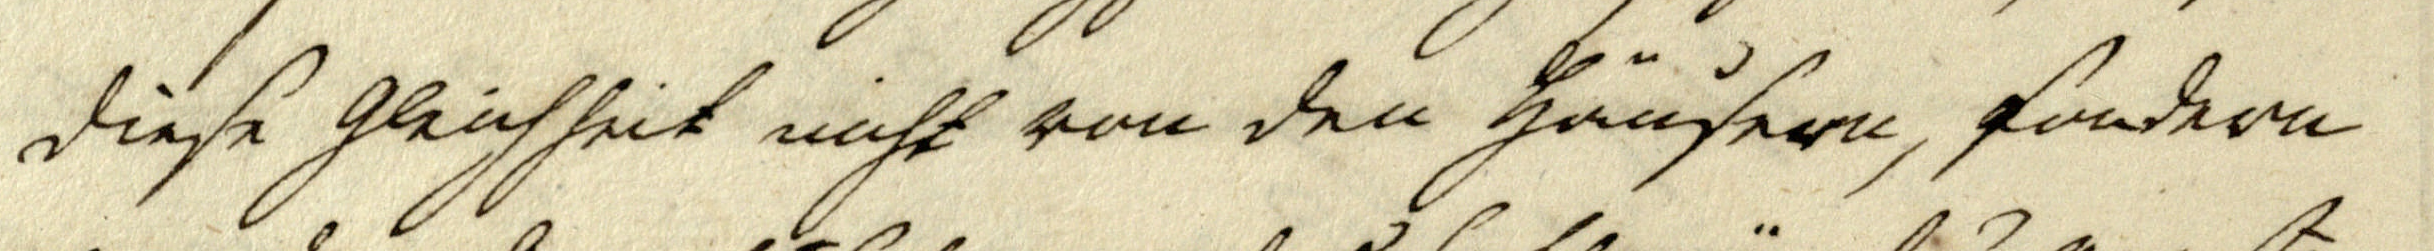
diese Gleichheit nicht von den Häusern, sondern
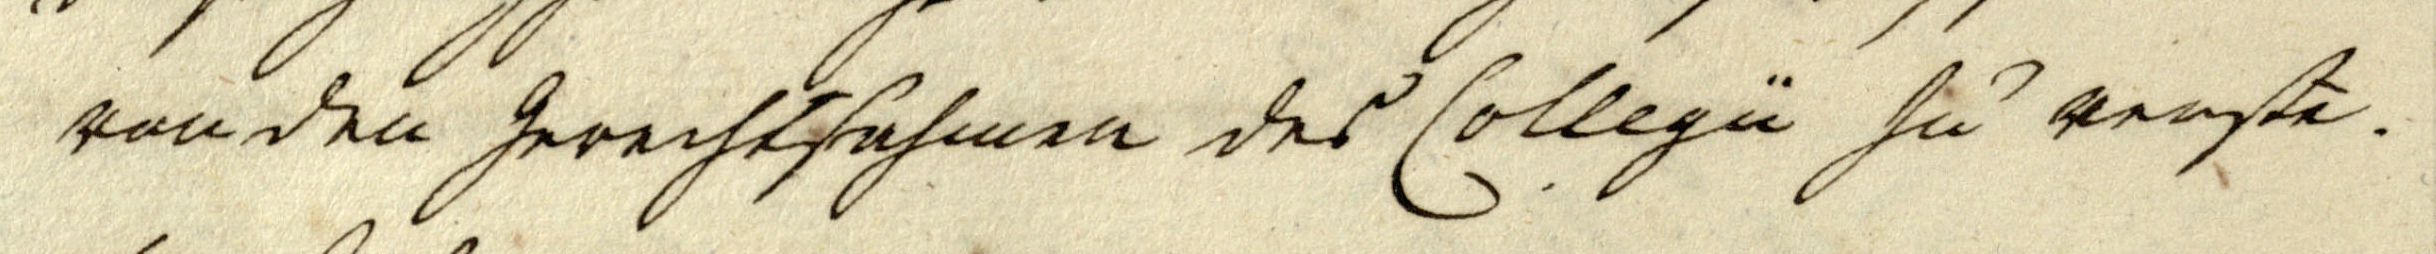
von den Gerechtsahmen des Collegii zu verste¬
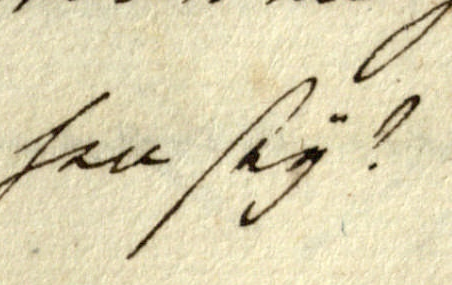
hen seÿ?
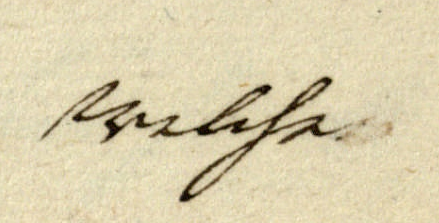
Welche
